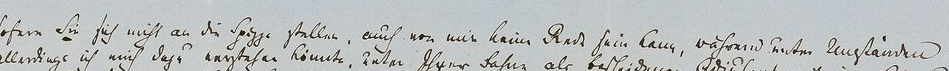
sofern Sie sich nicht an die Spizze stellen, auch von mir keine Rede sein kann, während unter Umständen
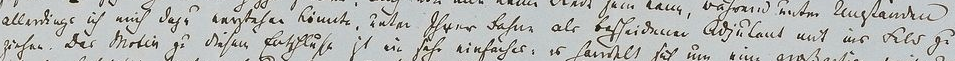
allerdings ich mich dazu verstehen könnte, unter Ihrer Fahne als bescheidener Adjutant mit ins Feld zu
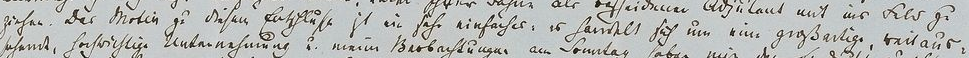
ziehen. Das Motiv zu diesem Entschluße ist ein sehr einfaches: es handelt sich um eine großartige, weit aus-
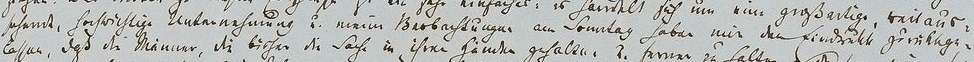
sehende, hochwichtige Unternehmung u. meine Beobachtungen am Sonntag haben mir den Eindruck zurückge-
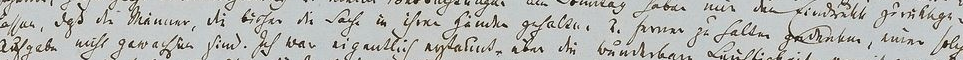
lassen, daß die Männer, die bisher die Sache in ihren Händen gehalten u. ferner zu halten gedenken, einer solchen
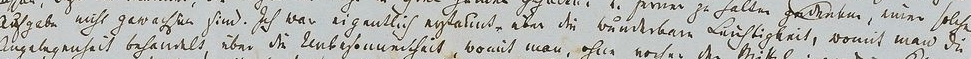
Aufgabe nicht gewachsen sind. Ich war eigentlich erstaunt über die wunderbare Leichtigkeit, womit man die
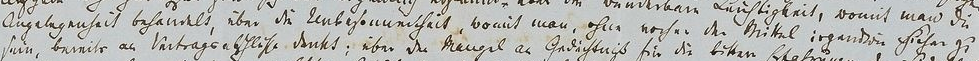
Angelegenheit behandelt, über die Unbesonnenheit, womit man, ohne vorher der Mittel irgendwie sicher zu
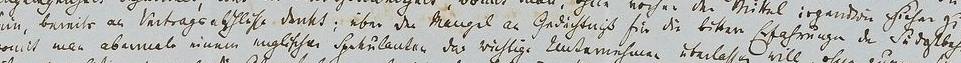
sein, bereits an Vertragsabschlüße denkt; über den Mangel an Gedächtniß für die bittren Erfahrungen der Südostbahn,
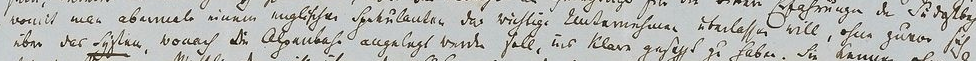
womit man abermals einem englischen Spekulanten das wichtige Unternehmen überlassen will, ohne zuvor sich
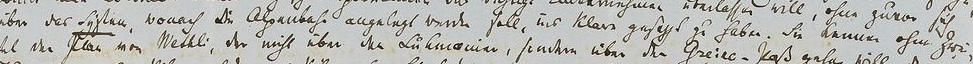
über das System, worauf die Alpenbahn angelegt werden soll, ins Klare gesezzt zu haben. Sie kennen ohne Zwei-
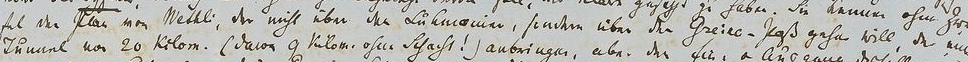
fel den Plan von Wethli, der nicht über den Lukmanier, sondern über den Greina-Paß gehen will, der einen
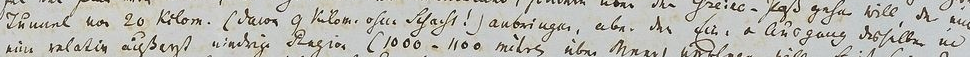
Tunnel von 20 Kilom. (davon 9 Kilom. ohne Schacht! ) anbringen, aber den Ein- & Ausgang desselben in
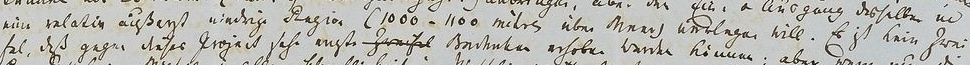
eine relativ äußerst niedrige Region (1000–1100 mètres über Meer) verlegen will. Es ist kein Zwei-
